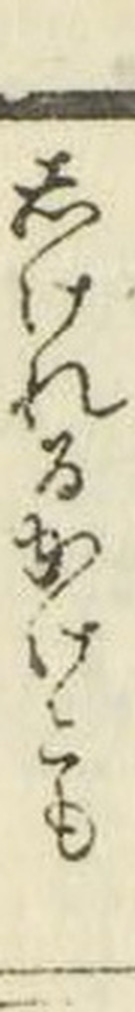しけれるかけとも
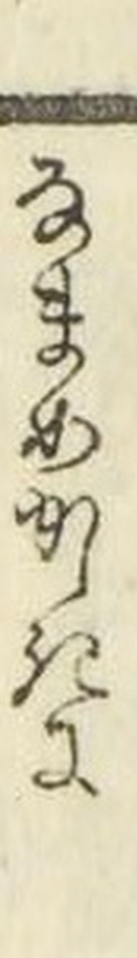なまめかきに
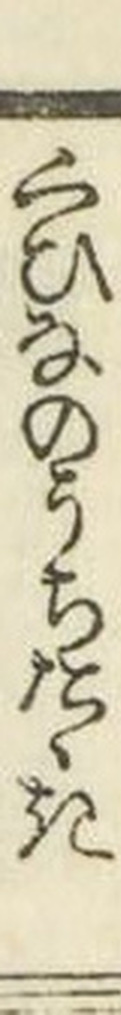くひなのうちたゝき
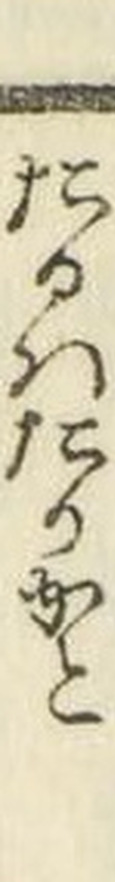たるはたかかと
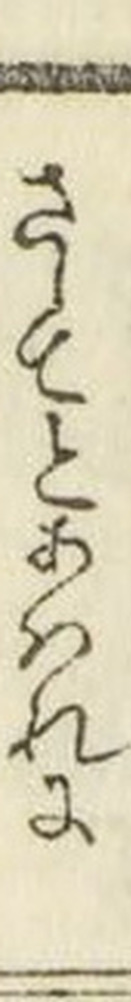さしてとあはれに
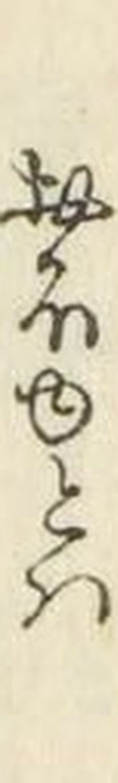おほゆとは
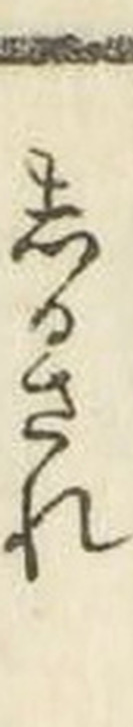しるされ
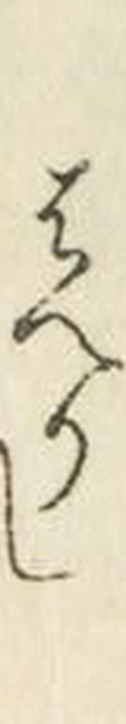はへりし

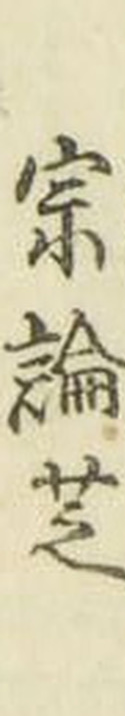宗論芝
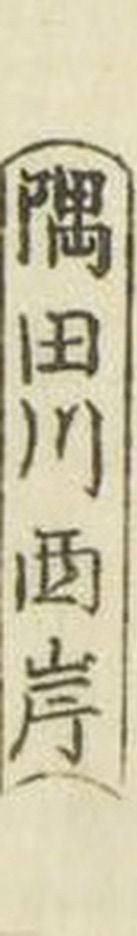隅田川西岸

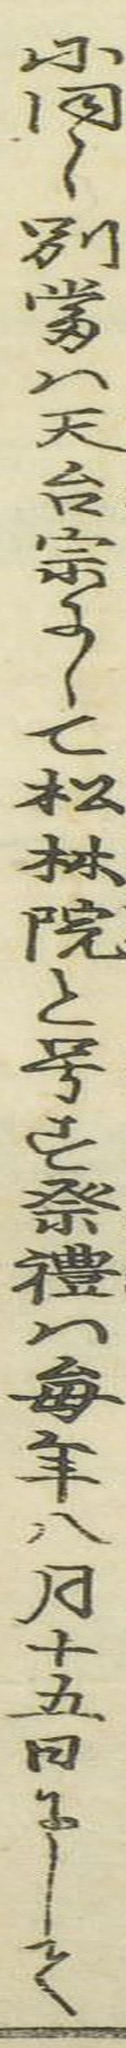に同し別当は天台宗にして松林院と号す祭礼は毎年八月十五日にして
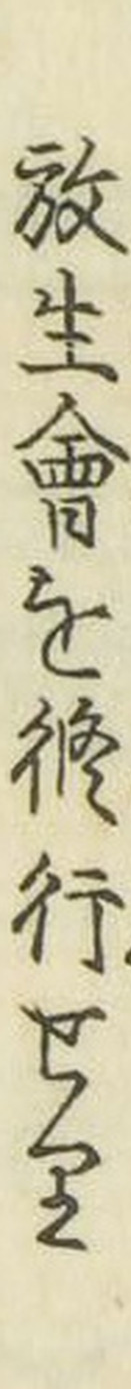放生会を修行せり
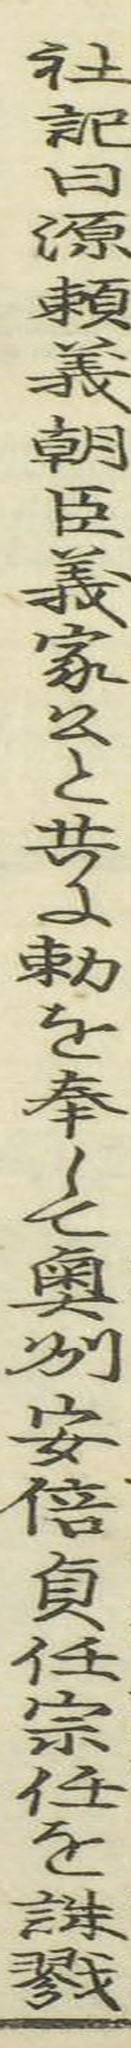社記曰源頼義朝臣義家公と共に勅を奉して奥州安倍貞任宗任を誅戮
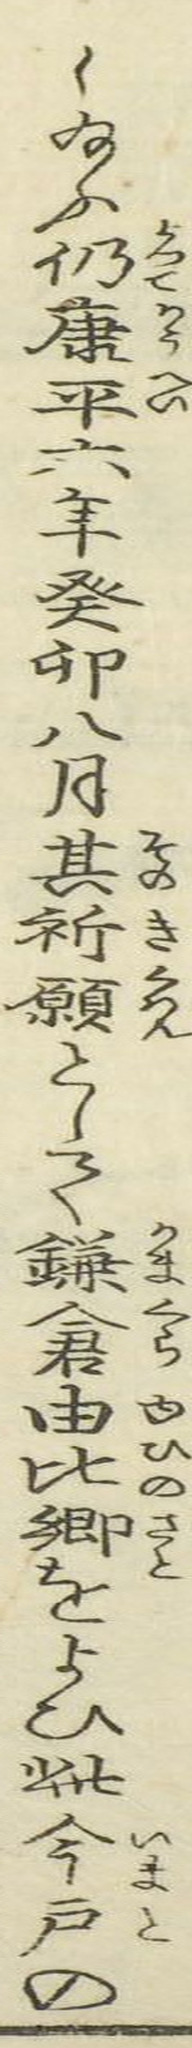し給ふ仍康平六年癸卯八月其祈願として鎌倉由比郷をよひ此今戸の
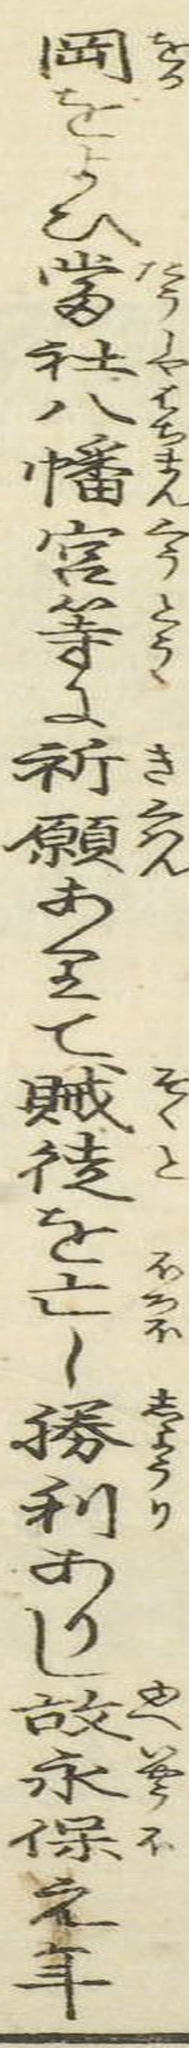岡をよひ当社八幡宮等に祈願ありて賊徒を亡し勝利ありし故永保元年
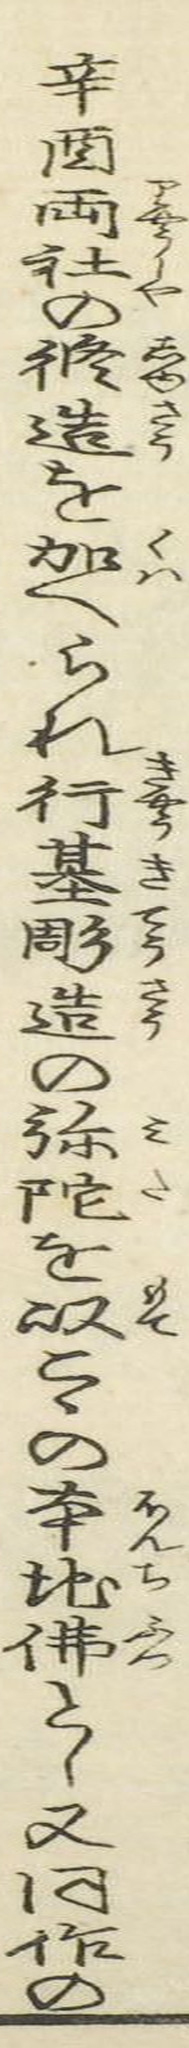辛酉両社の修造を加へられ行基彫造の弥陀を以こゝの本地仏とし又同作の
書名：江戸名所図会 20巻 巻之17
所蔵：東京学芸大学教育コンテンツアーカイブ
